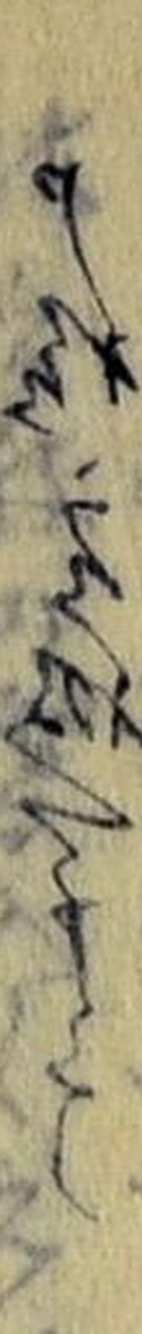七月廿一日
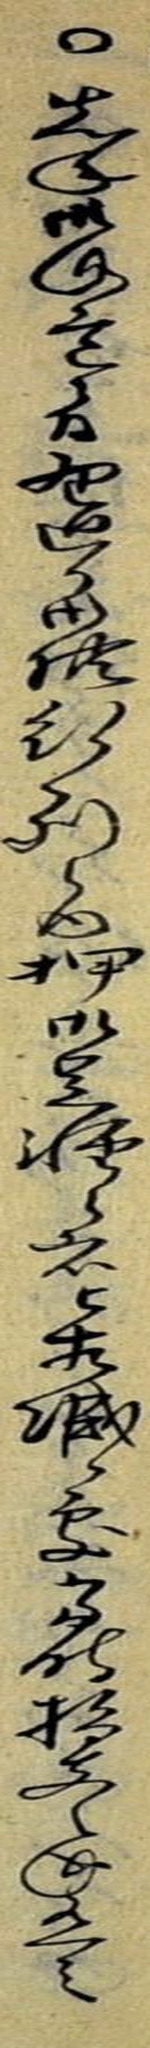〇先年御趣意ニ付野廻り御供行列之内押御足軽之者被相減候処当時指支候趣有之
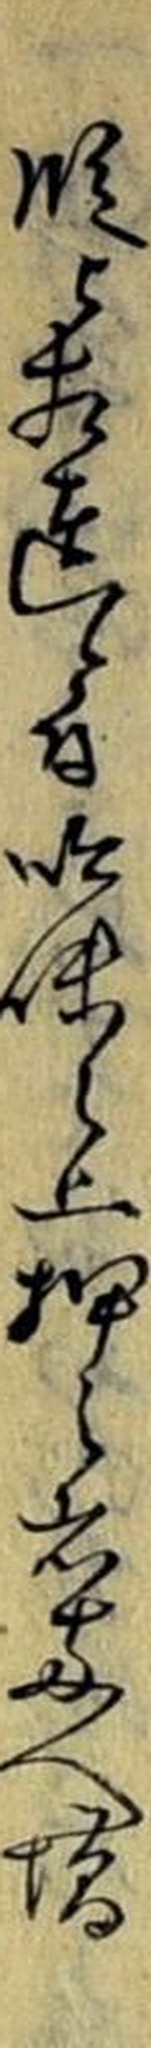段被相達候ニ付吟味之上押之者両人増
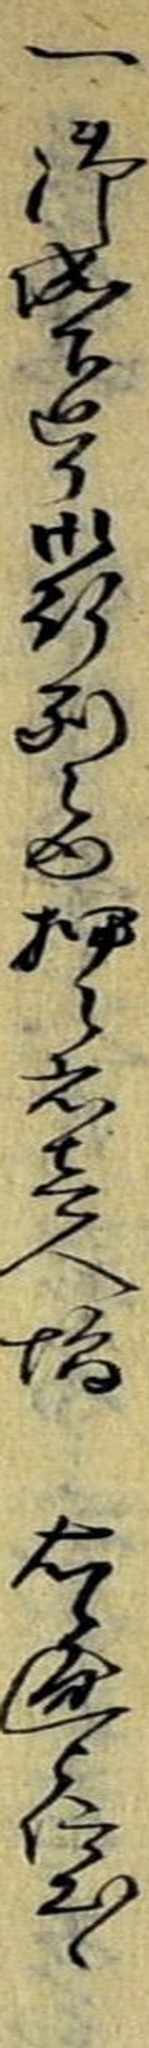一御城下廻り御行列之内押之者壱人増右之通被仰出候
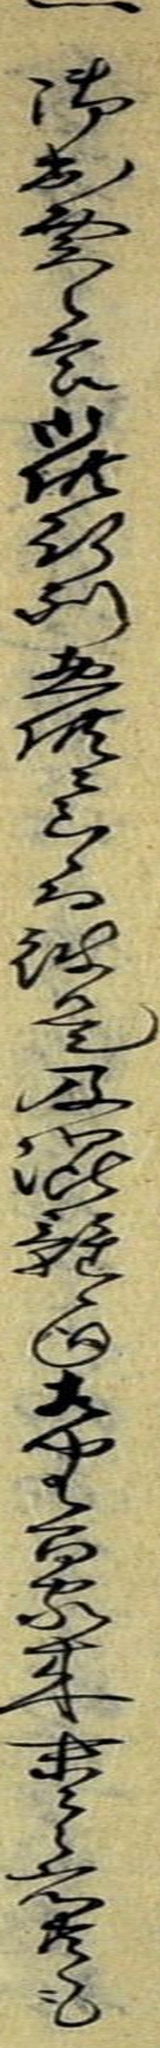一御出殿之節御供行列惣供ニ至候而彼是及混雑候趣相聞候間家来末々之者共へも
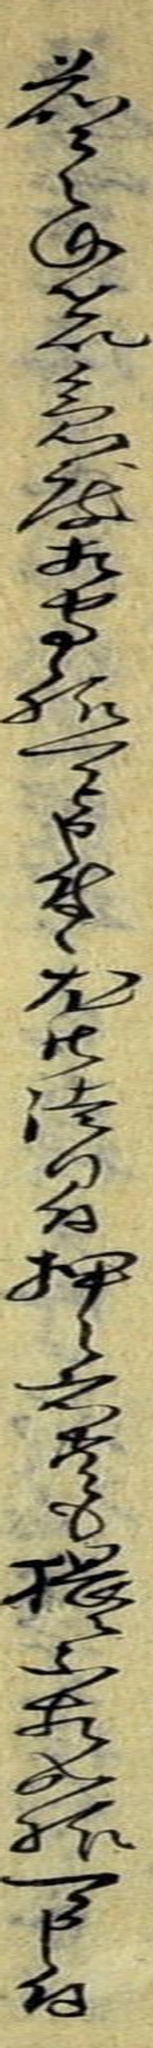前々之趣を以急度相守候様可被申付候尤御徒目付押之者共へも猥ニ不相成様可申付
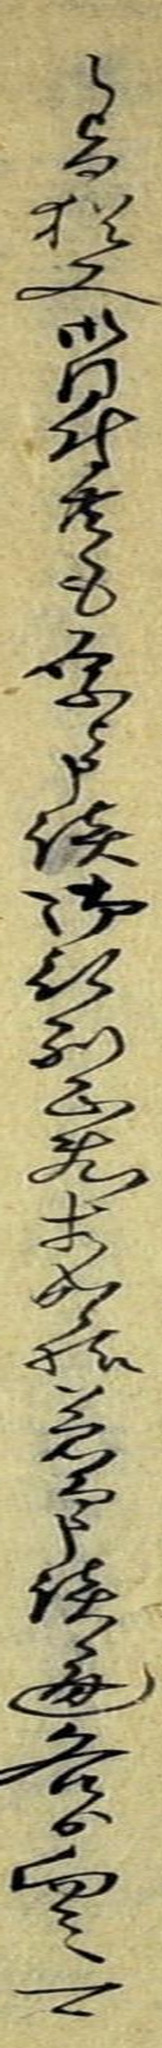候旨猶又御目付共へも厚被申談御行列正敷相成候様兼而申談候通各ゟ向々へ可
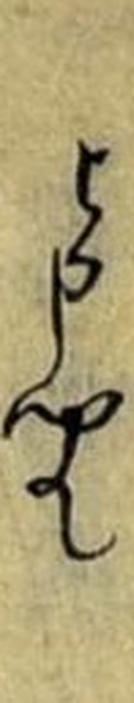被申聞候
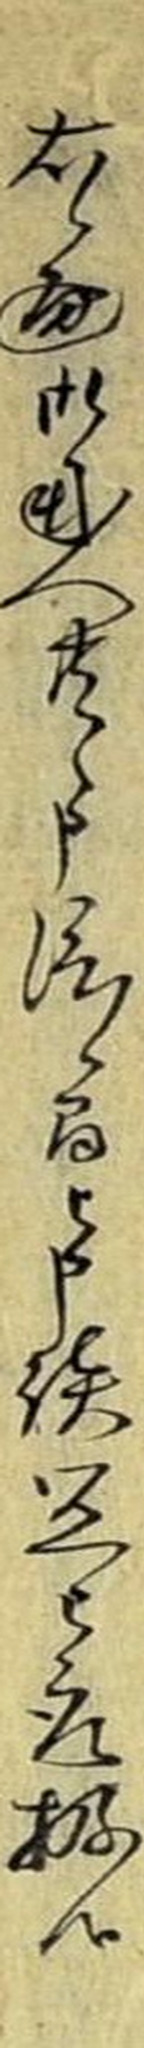右之通御用人共へ申渡候間被申談宜被取扱候
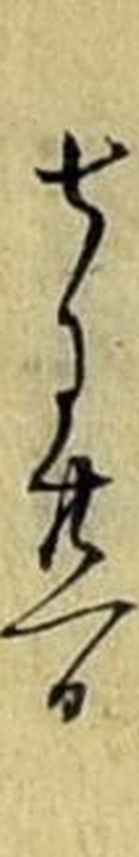七月廿一日
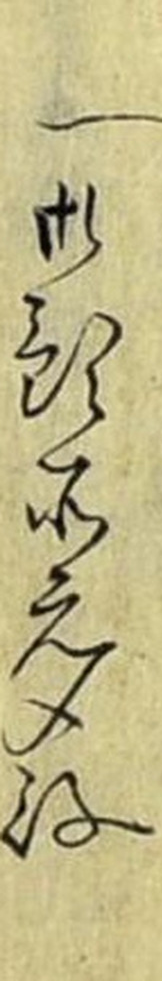御預所元〆役
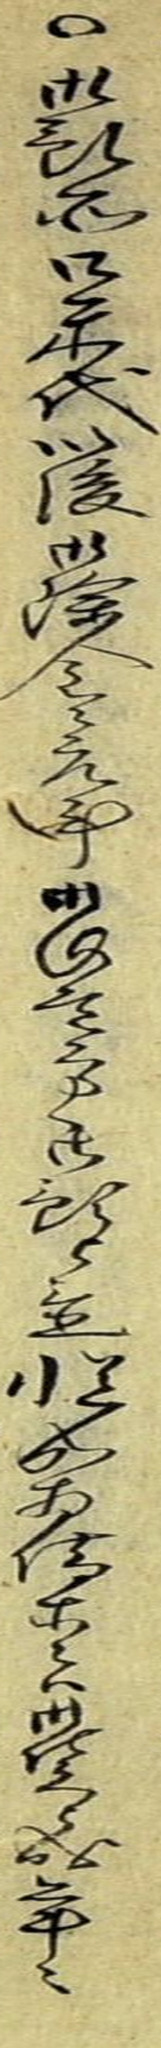〇御預所口米代以後御除金ニ取計御趣意方へ御預被置慥成拝借等ニハ御貸被成年々
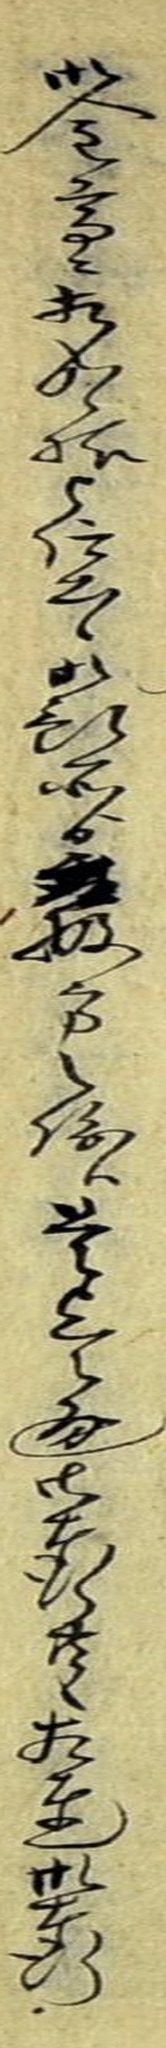御金高ニ相成候様被仰出候御預所ゟ取扱方之儀ハ是迄之通御奉行共へ相達御奉行
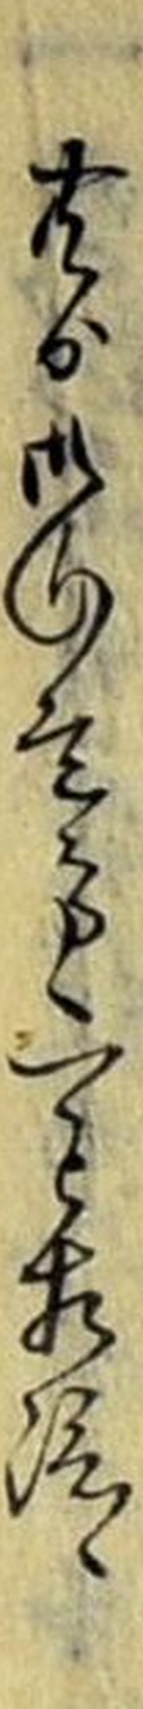共ゟ御趣意方へ可被相渡候

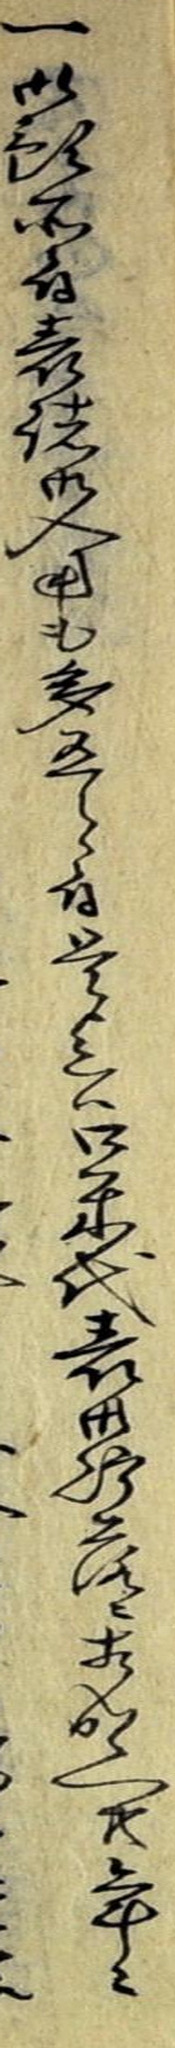一御預所ニ付表諸入用も多有之候ニ付是迄ハ口米代表御貯落ニ相成候へ共年々
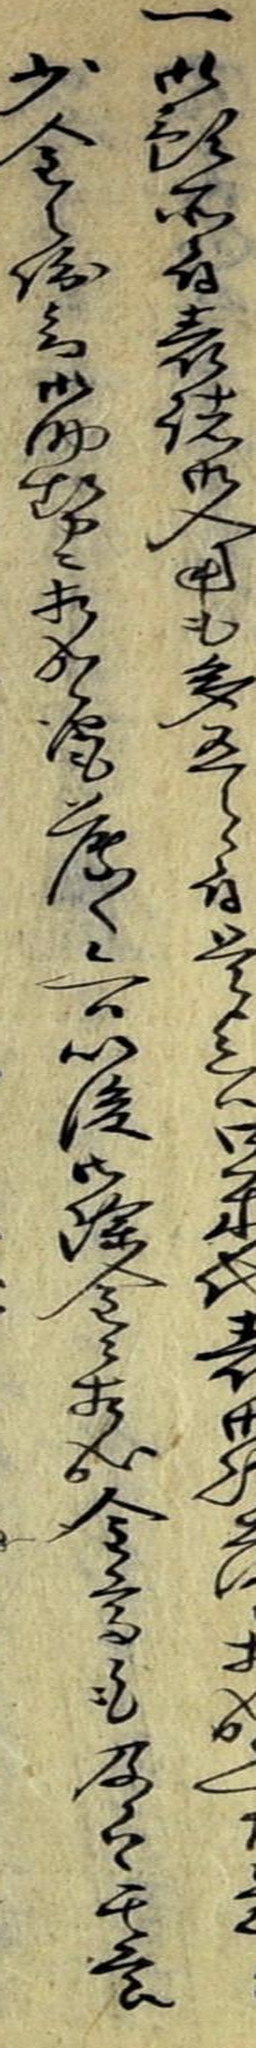少金之儀ニ而御助勢ニ相成候儀も薄く候ヘハ以後御除金ニ相成金高ニも及候ハヽ其節
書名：命令之部 三
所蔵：福井県文書館 Fukui Prefectural Archives
